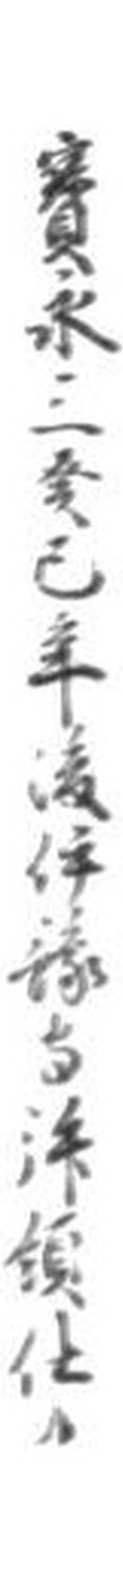宝永三癸巳年後伊予守拝領仕候
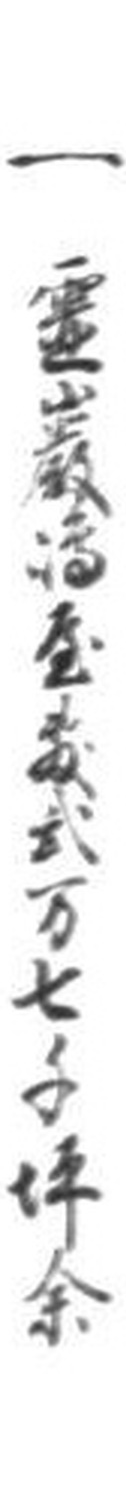一霊巌島屋敷弐万七千坪余

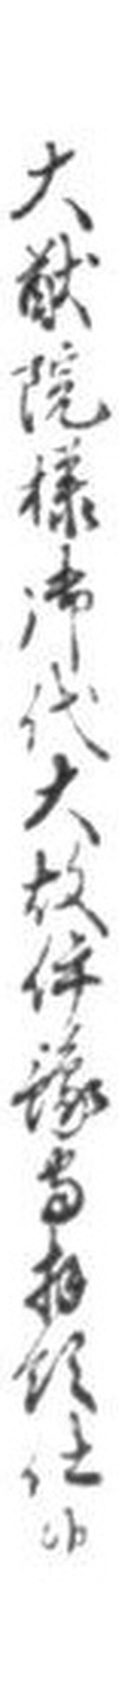大猷院様御代大故伊予守拝領仕候
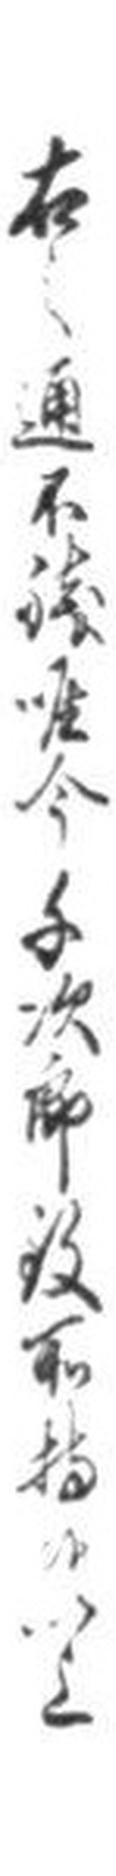右之通不残唯今千次郎致所持候以上
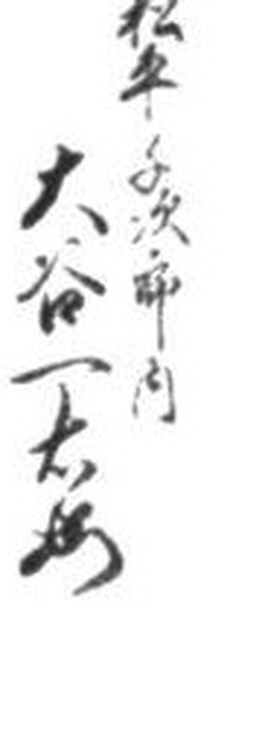大谷一右衛門
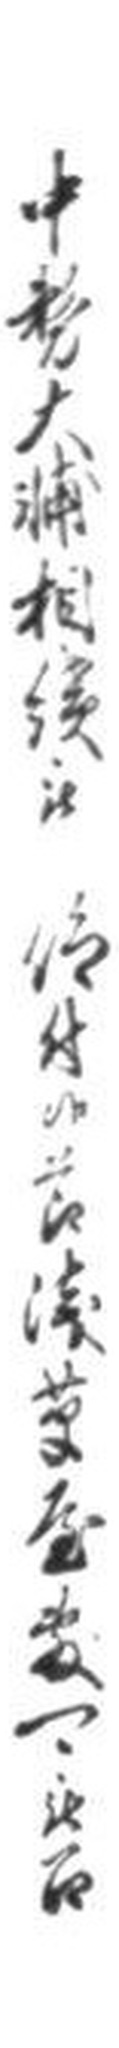中務大輔相続被仰付候節浅草屋敷可被召
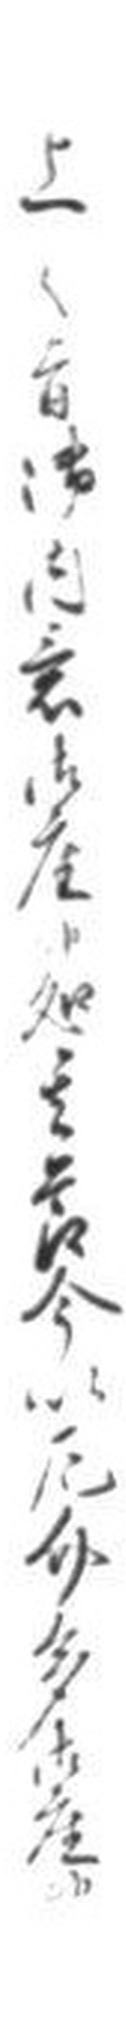上候旨御内意御座候処其節今以厄介多御座候
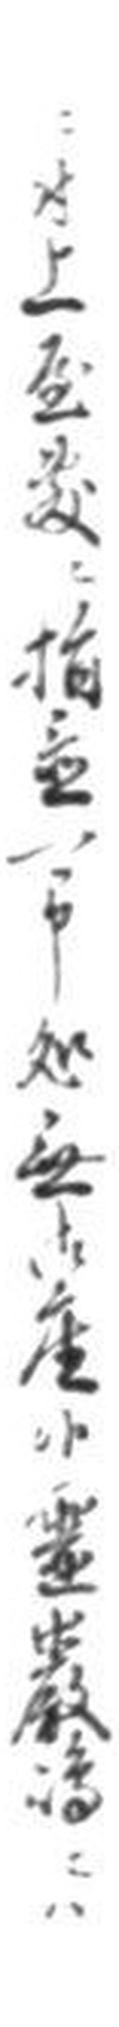ニ付上屋敷ニ指置可申処無御座候霊巖嶋ニハ
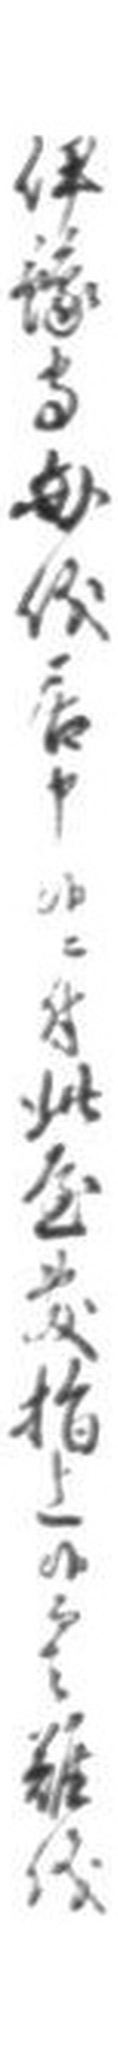伊予守母儀居申候ニ付此屋敷指上候而は難儀
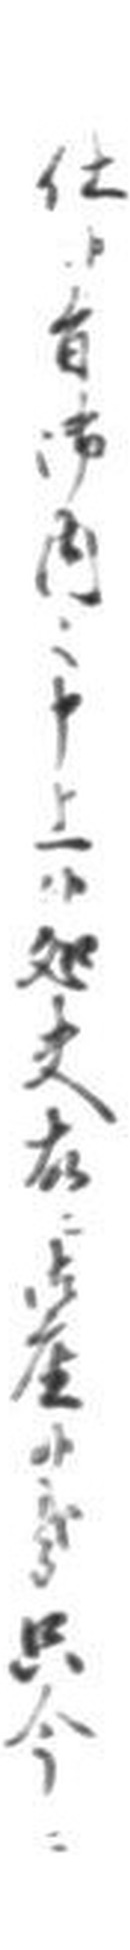仕候旨御内々申上候処夫故ニ御座候哉只今ニ
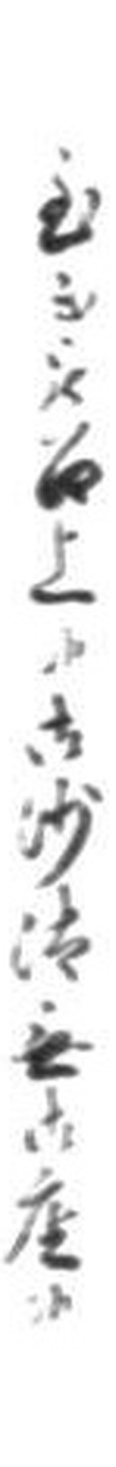至も被召上候御沙汰無御座候
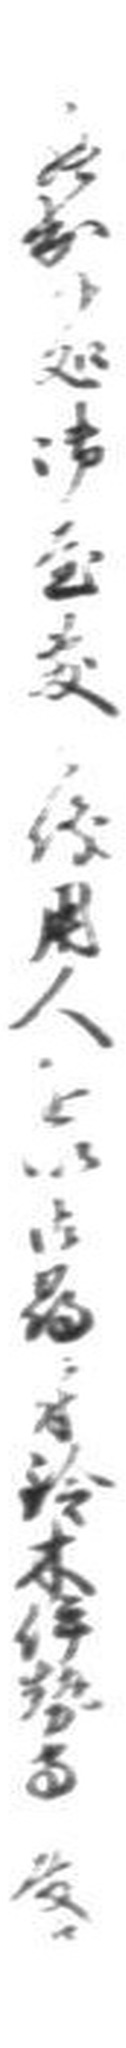罷出候処御屋敷儀用人を以御尋ニ付鈴木伊勢守殿江
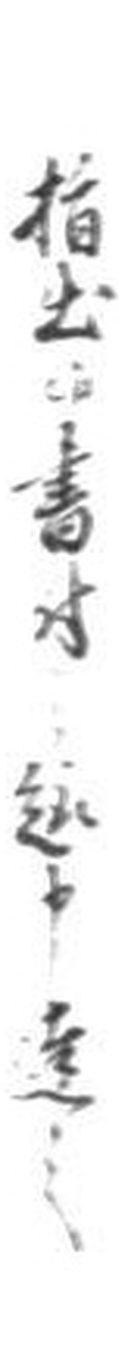指出候書付之趣申達之
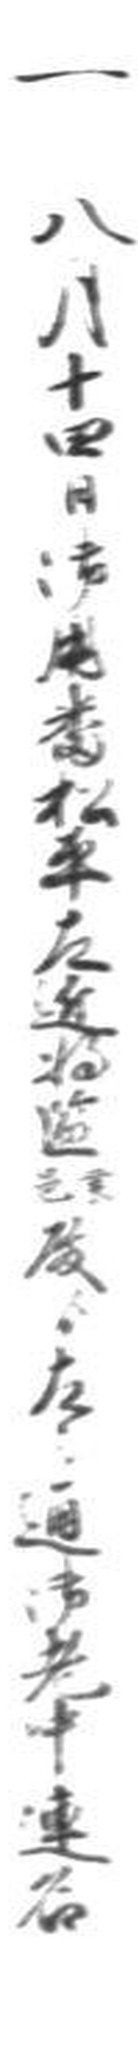一八月十四日御用番松平左近将監乗邑殿ゟ左之通御老中連名
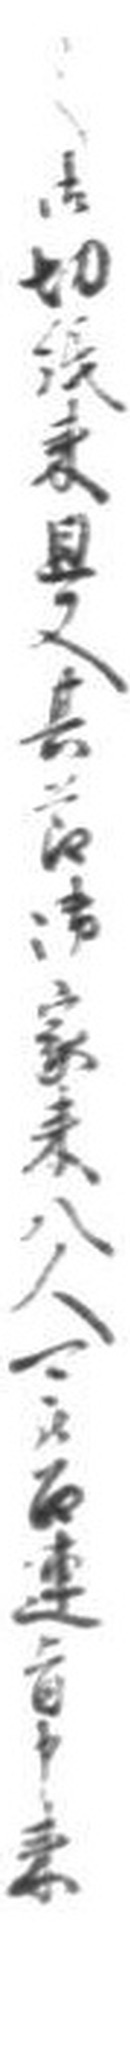之御切紙束且又其節御家来八人可被召連旨申来
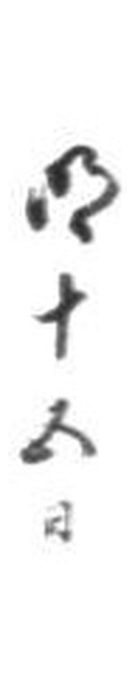明十五日
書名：家譜 三十九 宗矩公 享保十年
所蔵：福井県文書館 Fukui Prefectural Archives
